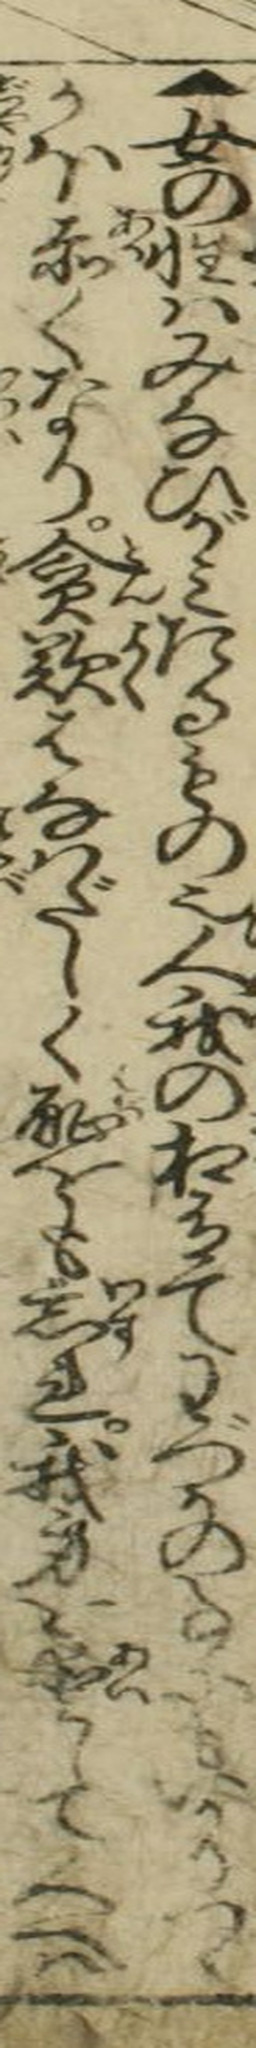かほ赤くなり。貪欲はなはだしく恥をも忘れ。我身を愛して人へは
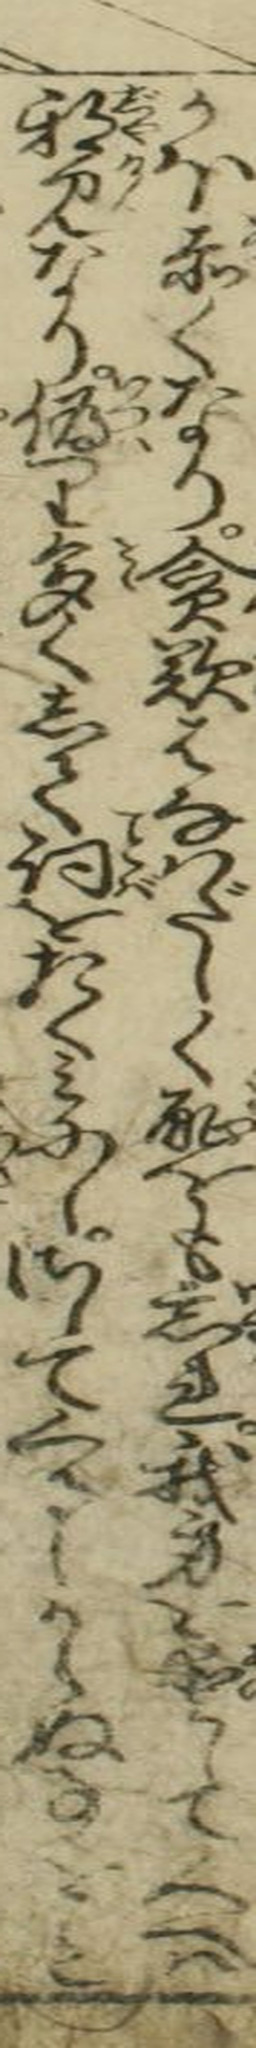邪見なり。偽り多くして詞をたくみにし。さてくるしからぬ事をも
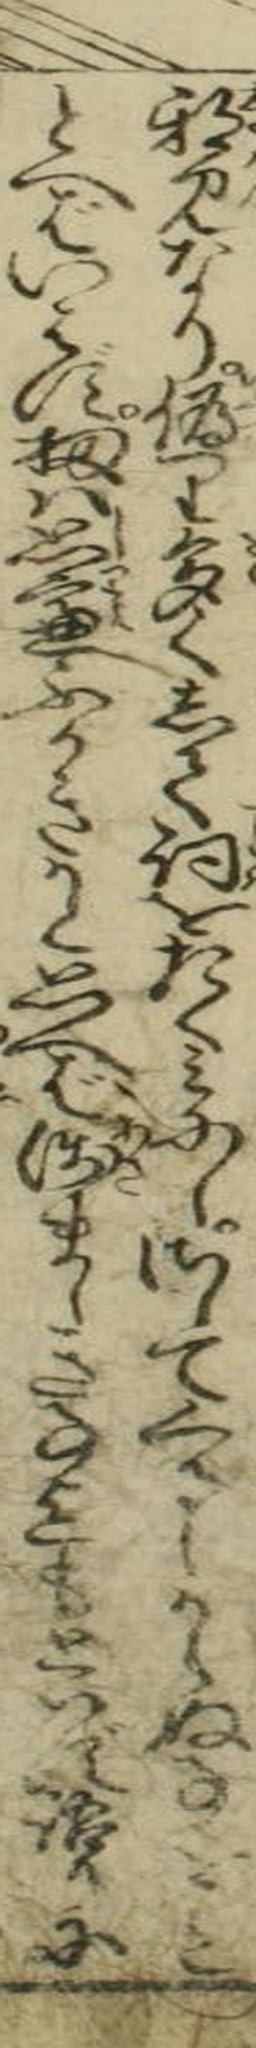とへばいはず。扨は思慮ふかきかと思へば浅ましき事をもとはず語りに
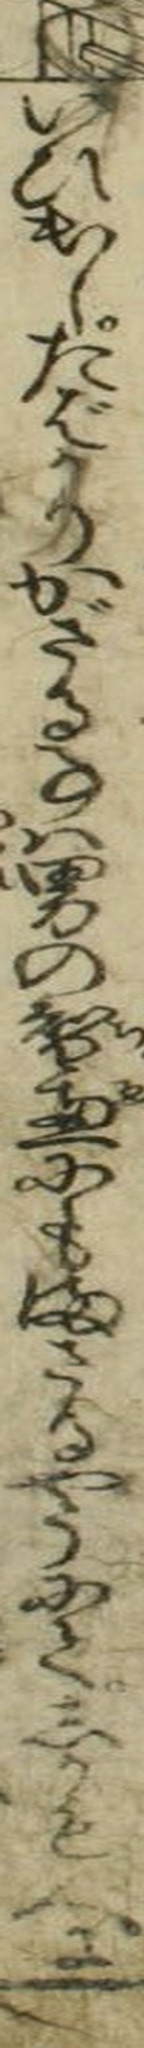いひ出し。たばかりかざる事は男の智恵にもまさるやうにて。しかも人に
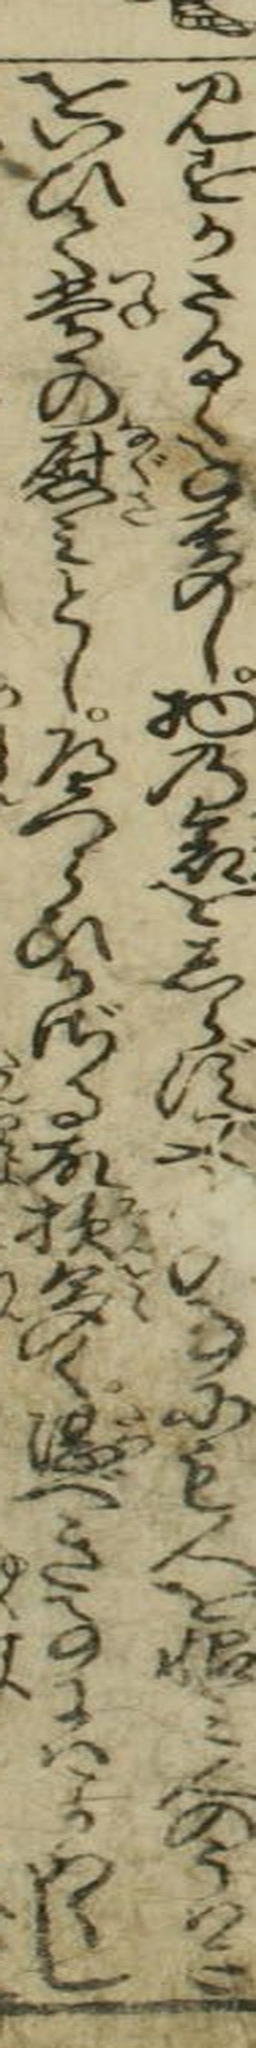をいひて常の慰みとし。へつらひかざる故損多く。絶べき事にはよはくし
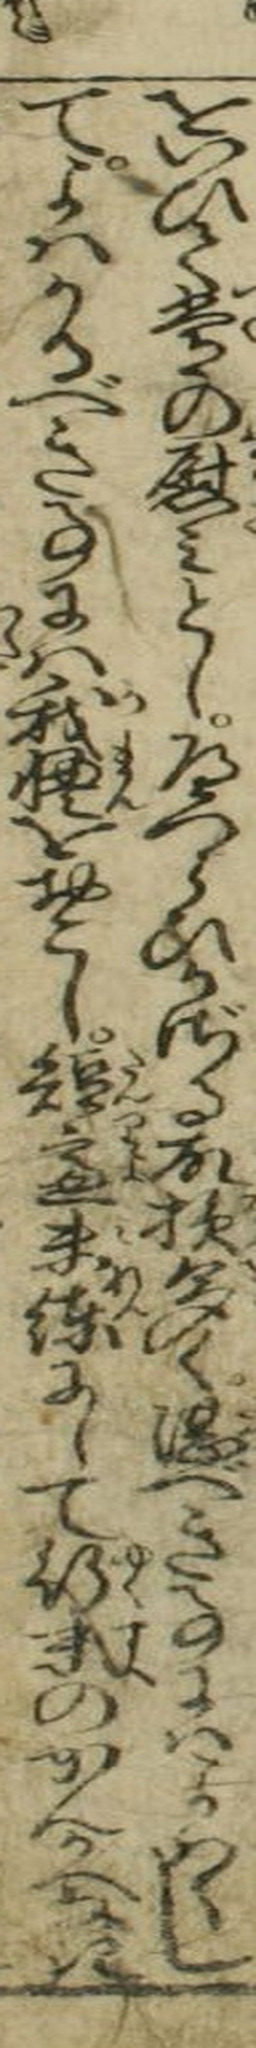て。よはかるべき事には我慢をおこし。短慮未練にして行末のかんかへなき
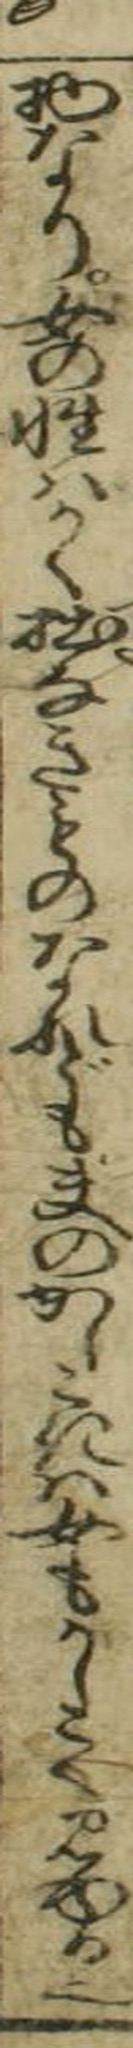物なり。女の性はかく拙なきものなれども夫のかしこきは女もかしこく見ゆる也

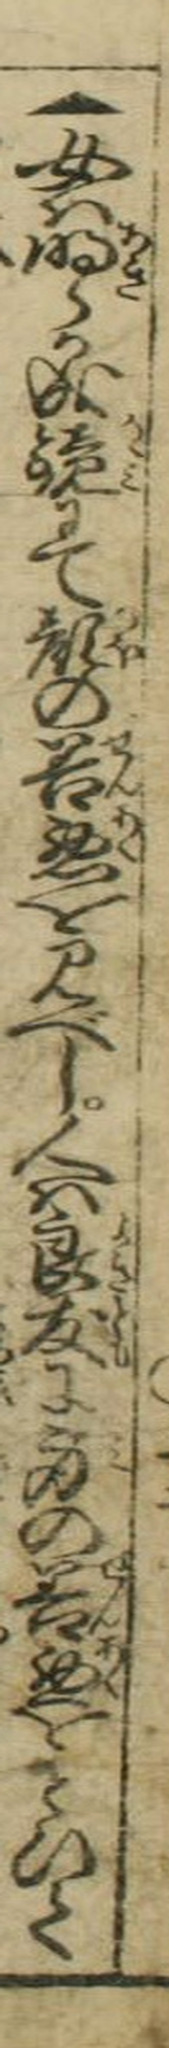▲女は明らか成鏡にて顔の善悪を見べし。人は良友に身の善悪をとひて
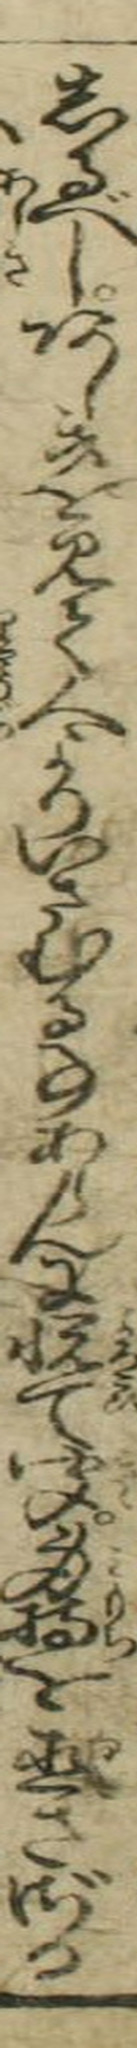しるべし。あしきを見て人よりいさむる事あらんに悦て聞。身持を直さざる
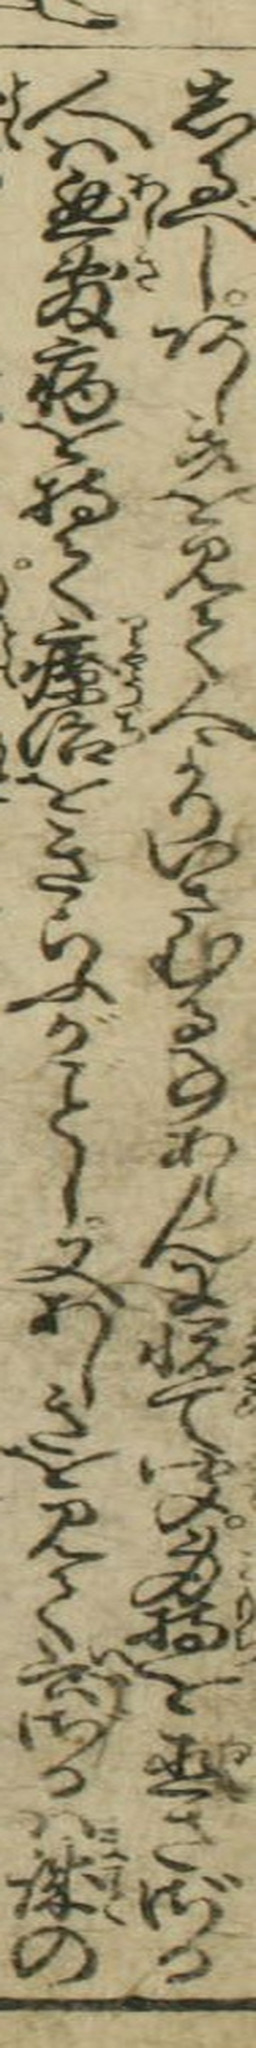人は悪敷病を持て療治をきらふがごとし。又あしきを見て云ざるは誠の
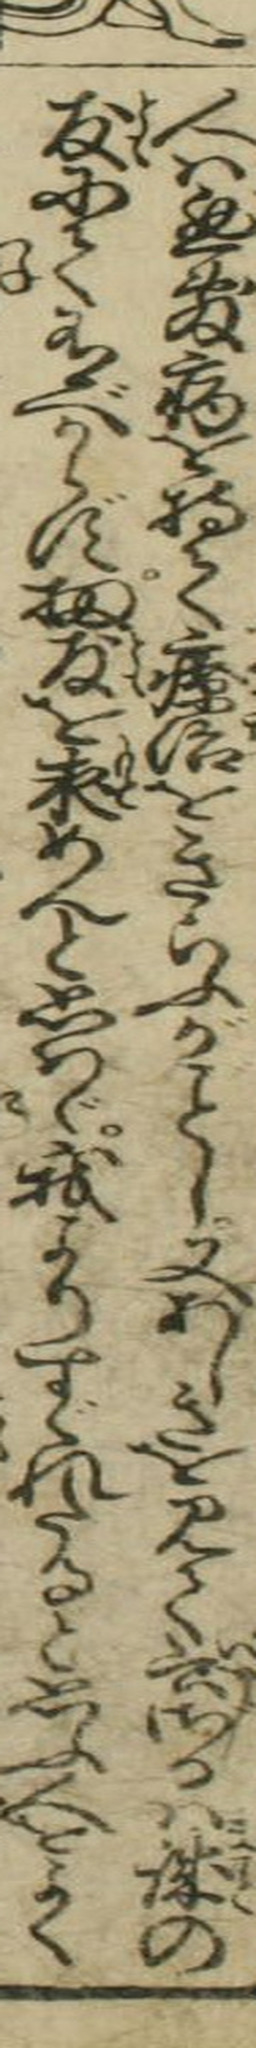友にて有べからず。扨友を求めんと思はゞ。我よりすぐれたると思ふ人をよく
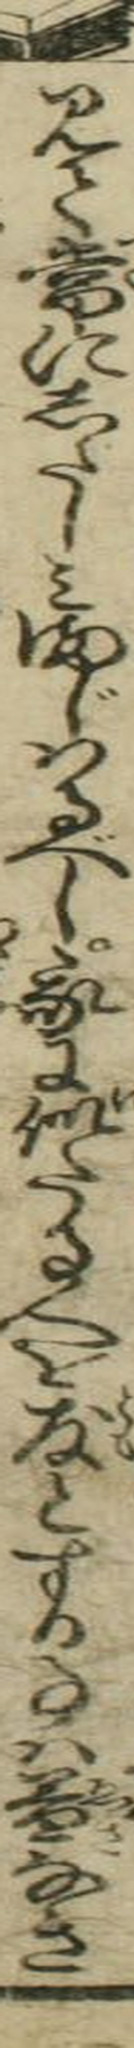見て常にしたしみまじはるべし。我に似たる人を友とする事は益なき
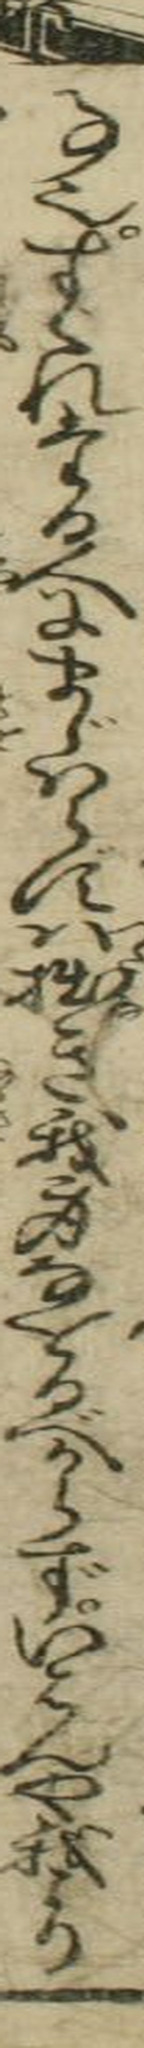事也。すぐれたる人にまじはらずは拙き我身なをるべからず。いはんや我より
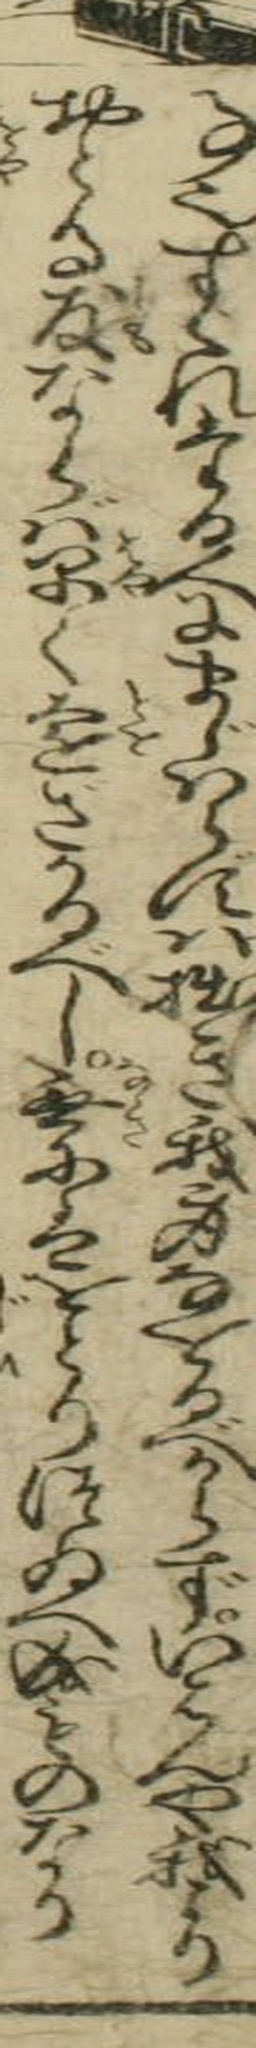おとる友ならば早く遠ざかるべし。無にはをとりつゐへ成ものなり
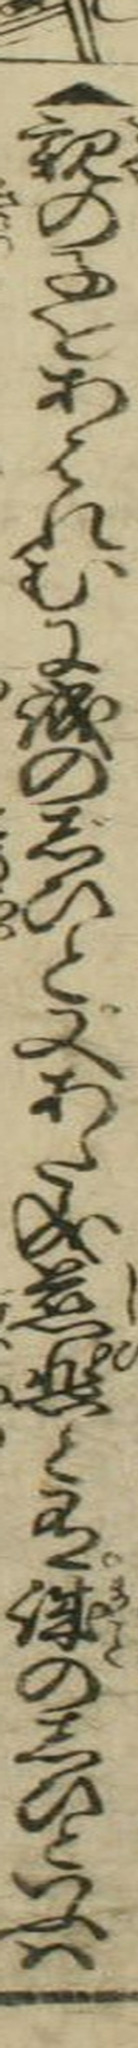▲親の子をあはれむに誠のじひと。又あた成慈悲と有。誠のしひといふは
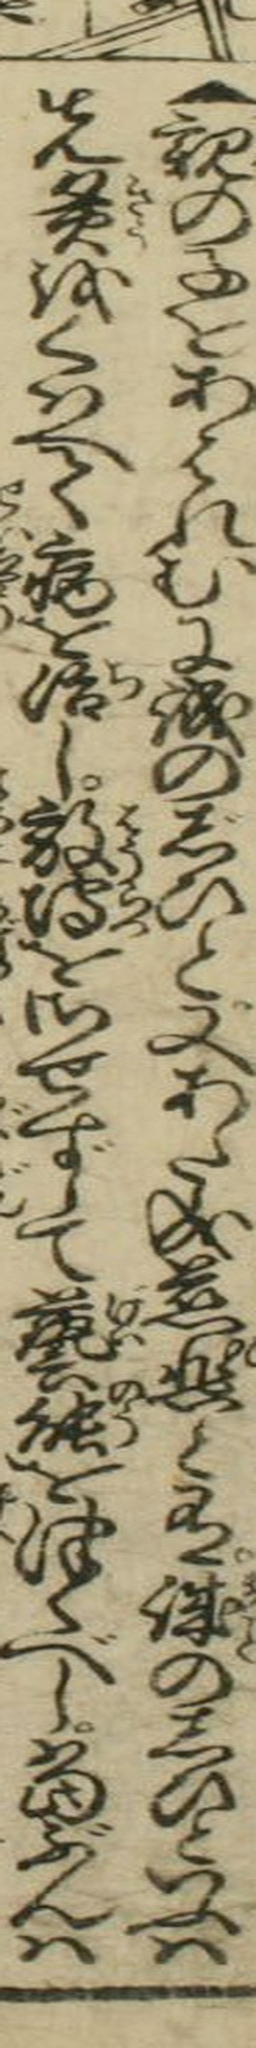先灸をくはへて病を治し。放埒をさせずして藝能をつくべし。當ぶんは
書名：女源氏教訓鑑
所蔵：東京学芸大学附属図書館
